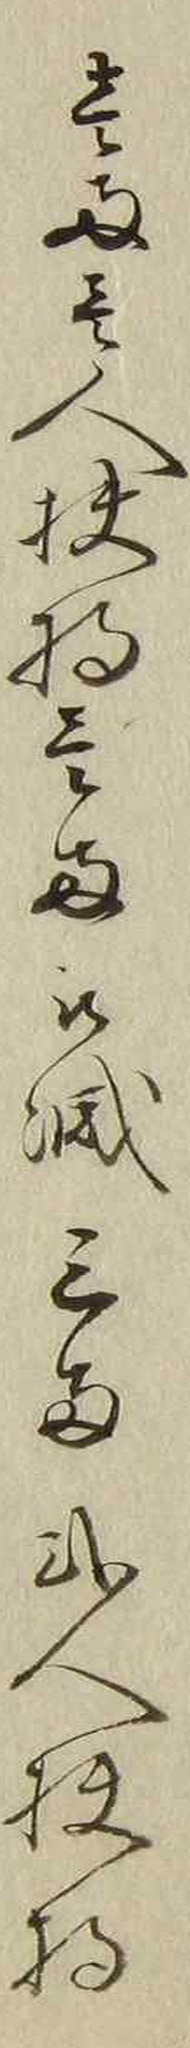壱両壱人扶持壱両被減三両弐人扶持
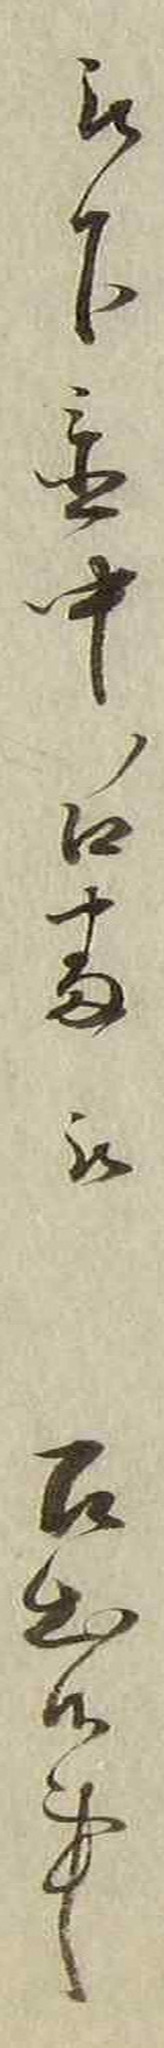被下置中ノ口番被召出候事
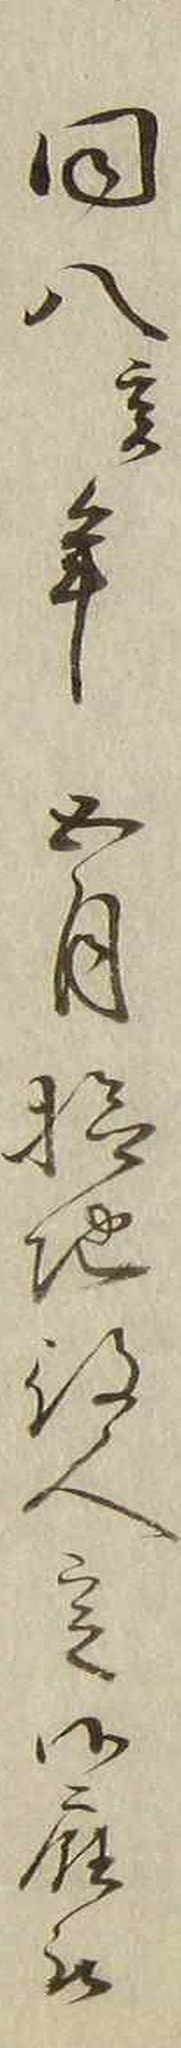一同八亥年五月検地役人定御雇被

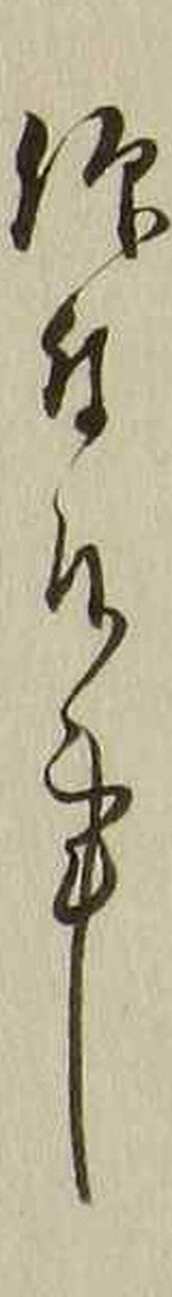仰付候事
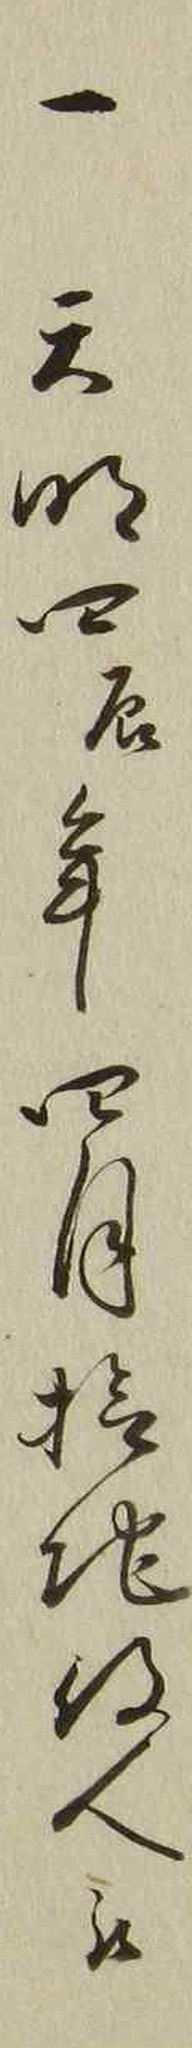一天明四辰年四月検地役人被
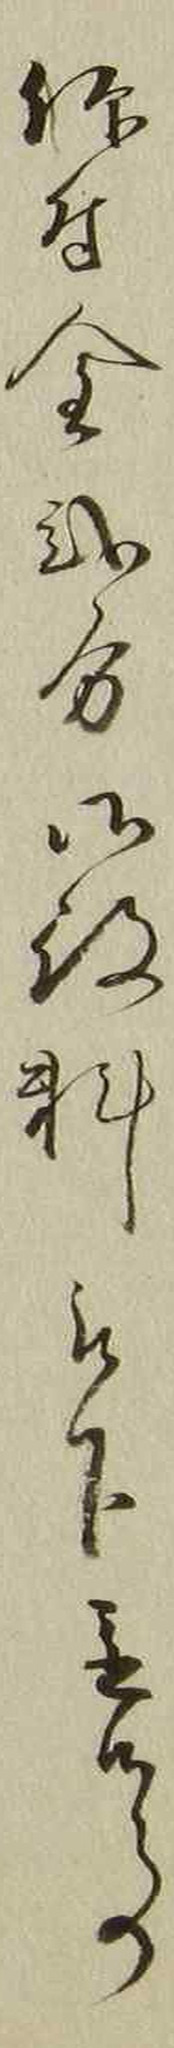仰付金弐分御役料被下置候事
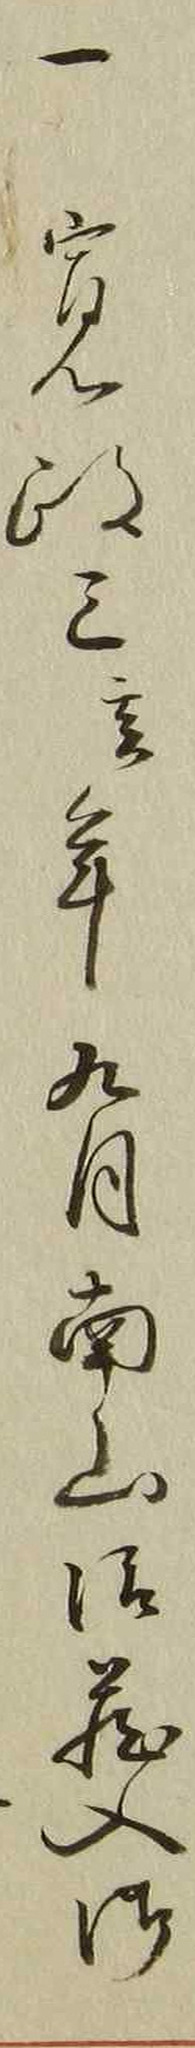一寛政三亥年九月南山御蔵入御
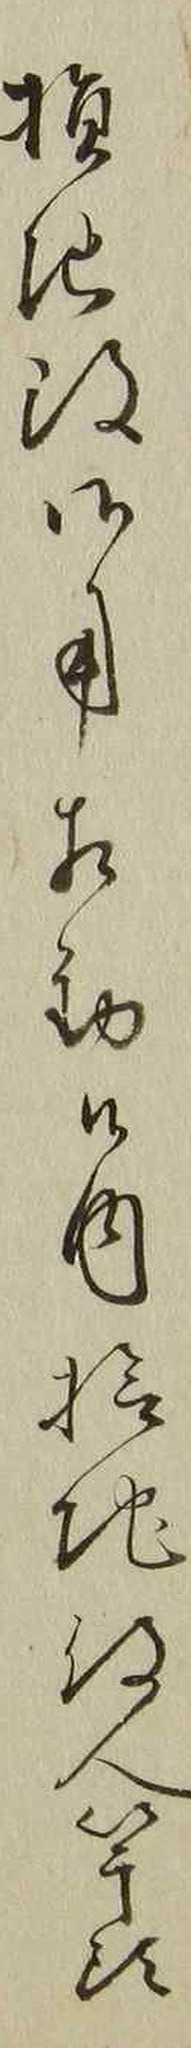損地改御用相勤候内検地役人竿頭
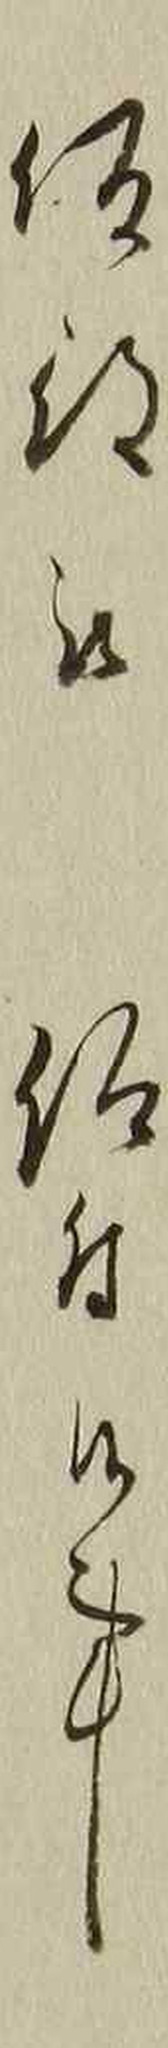仮役被仰付候事
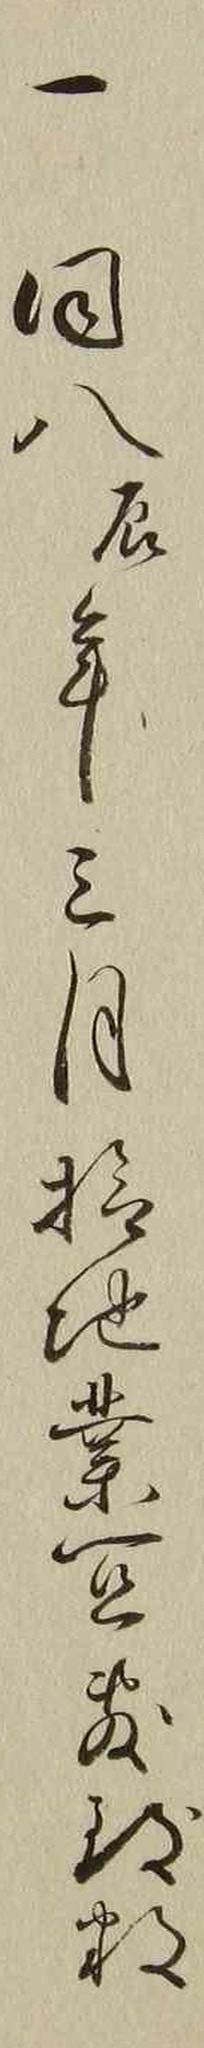一同八辰年三月検地業宜敷致数
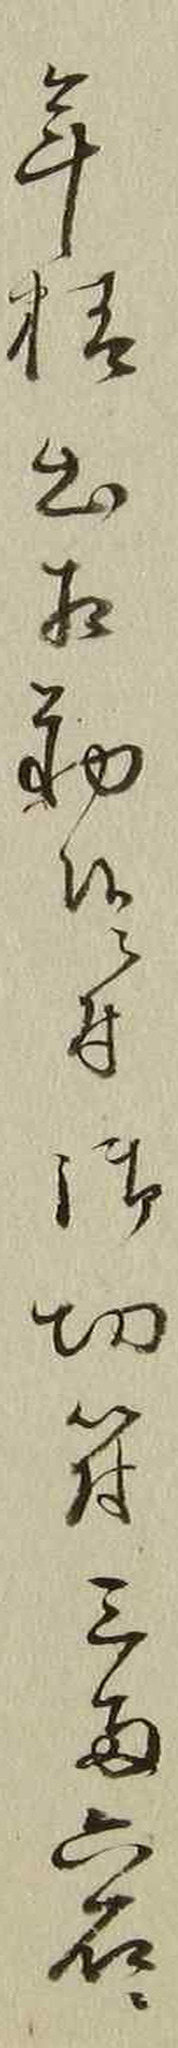年精出相勤候ニ付御切符三両六石ニ
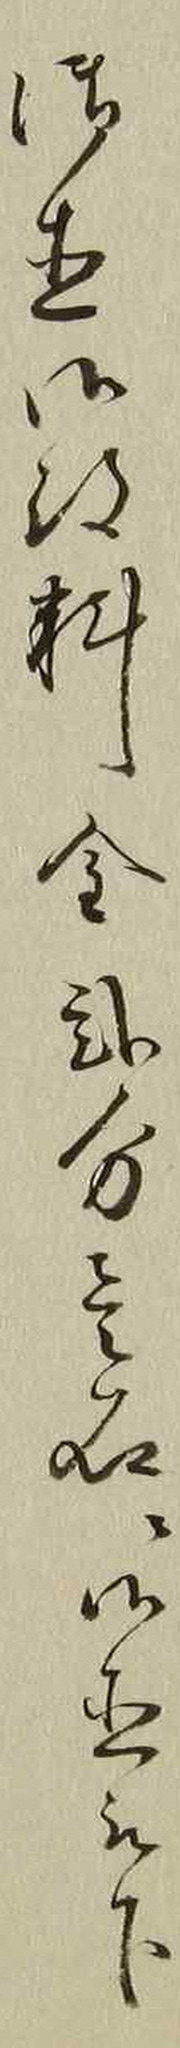御直御役料金弐分壱石ニ御直被下
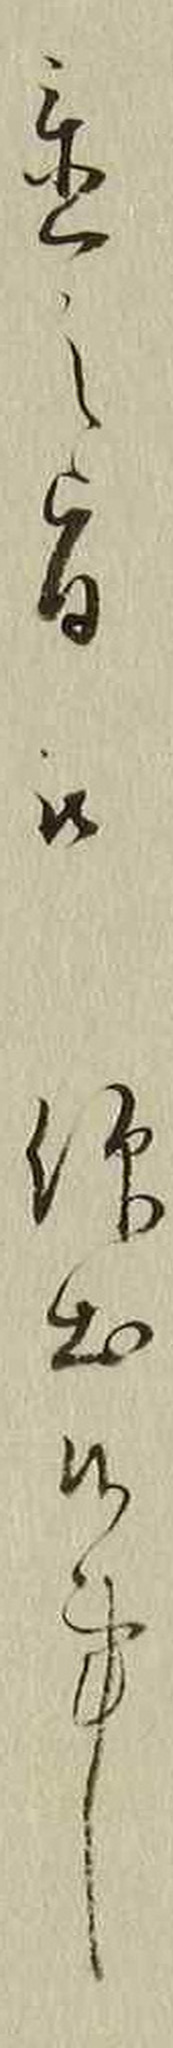置之旨被仰出候事
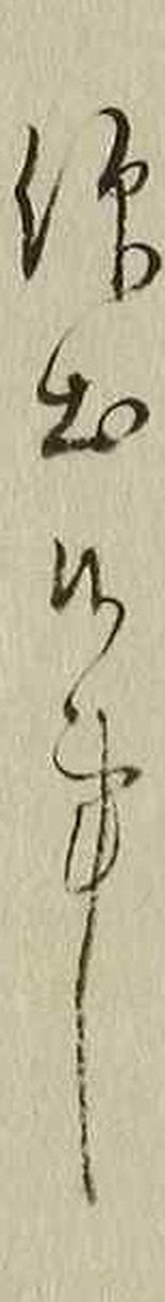仰付候事
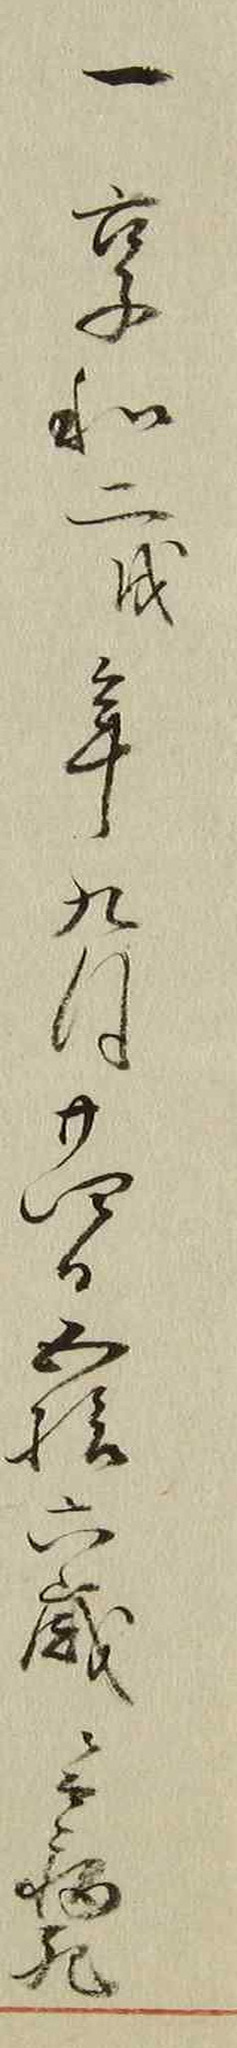一享和二戌年九月廿四日五拾六歳ニ而病死
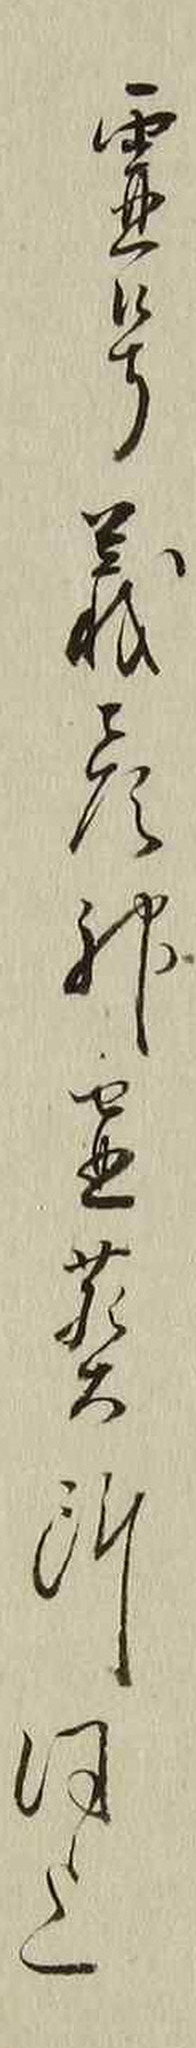霊号義彦神霊葬所同上
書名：諸士系譜　巻之32　い之部32
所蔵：会津若松市立会津図書館
